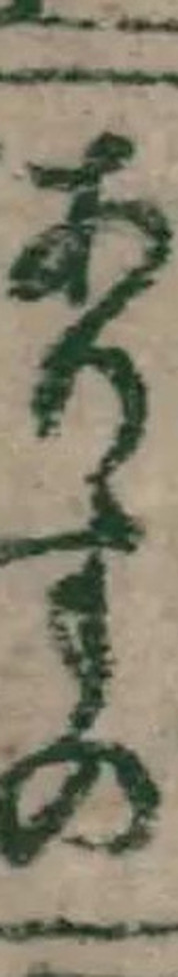ありすの
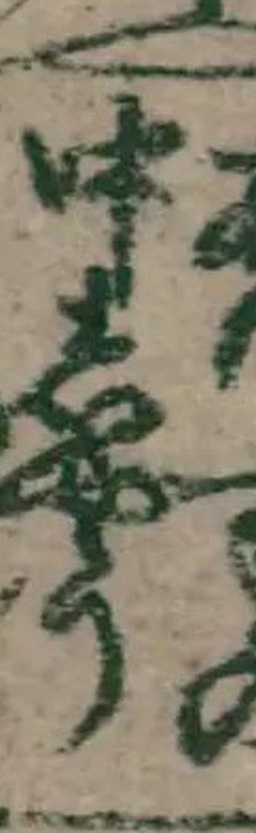中しやう
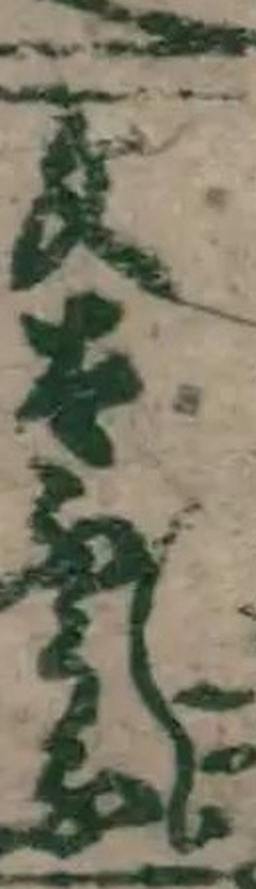文太ふうふ
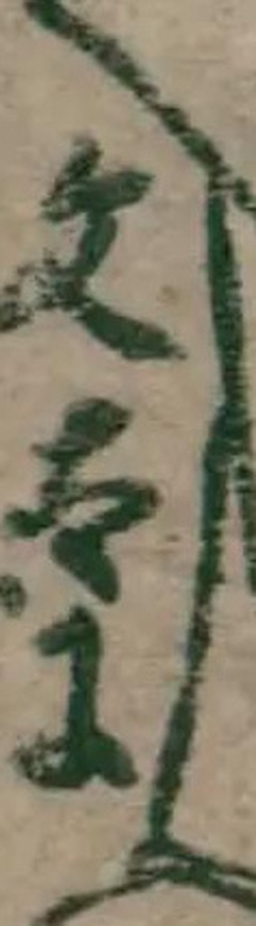文太よ
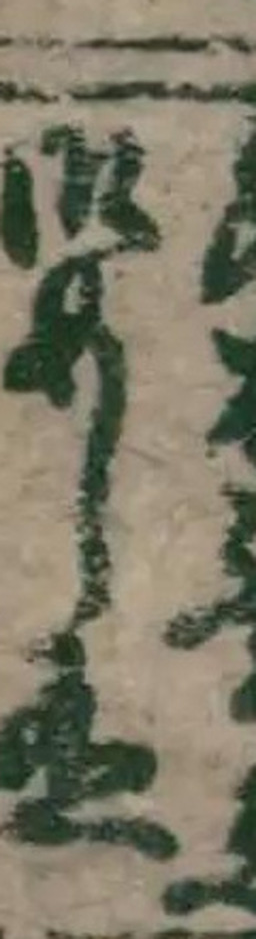御めし有
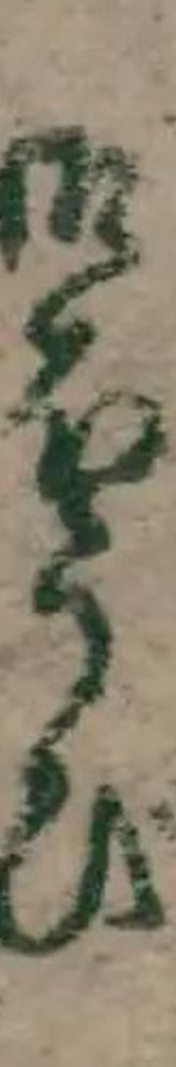御ほうび
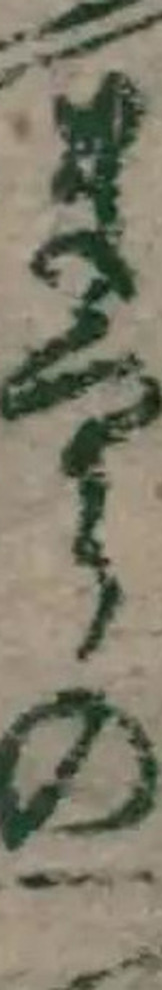まくらの
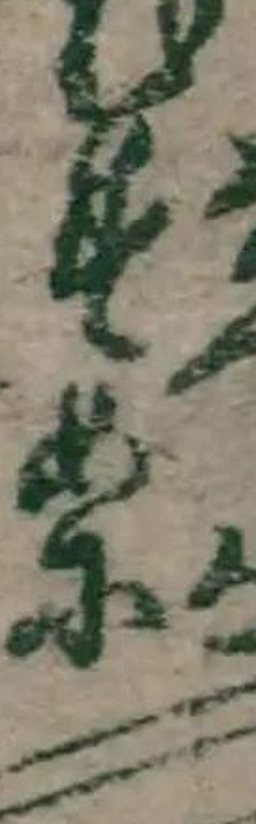むすめに
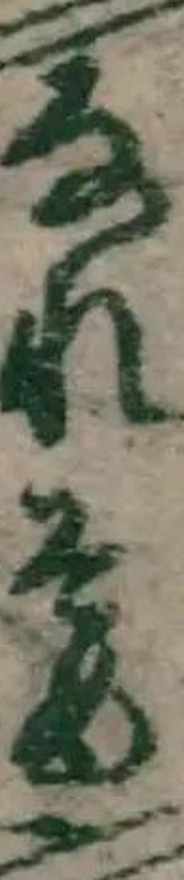なれそめ
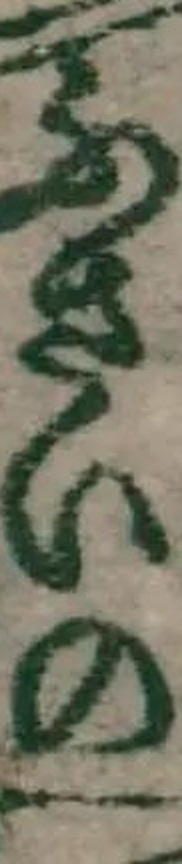ふさいの
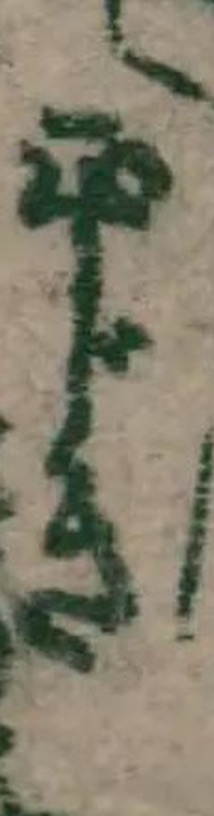正じき
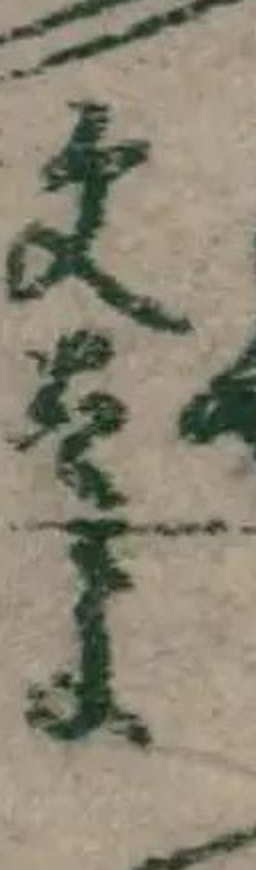文太よ
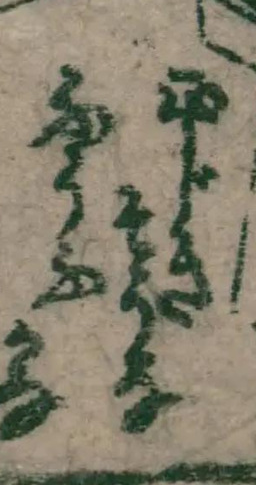ふうふかな
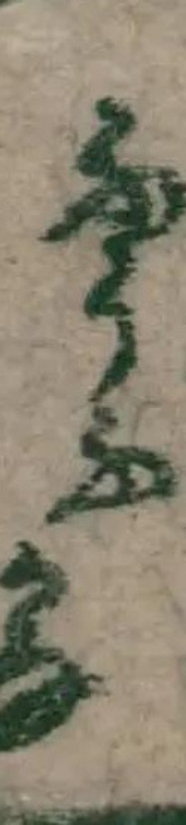ふうふかな

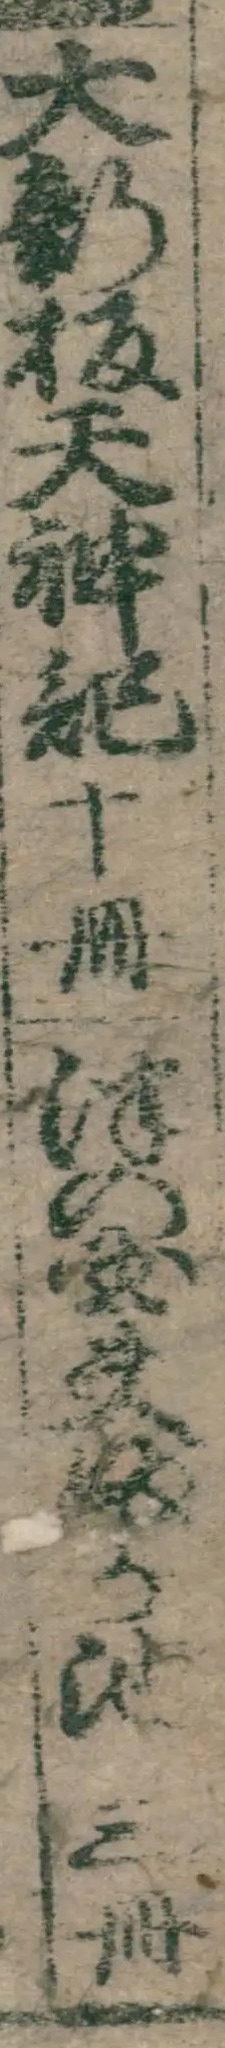大新板天神記十冊津の国夫婦か池三冊
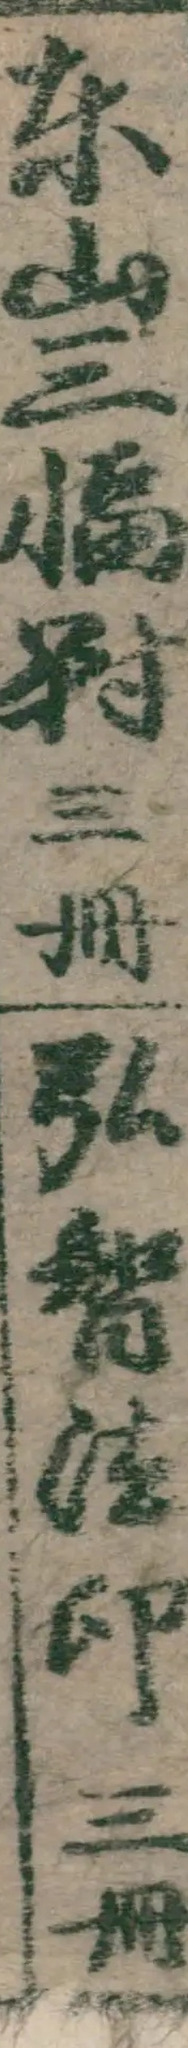東山三幅対三冊弘智法印三冊
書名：塩売文太物語 2巻
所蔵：国立国会図書館 National Diet Library, JAPAN
